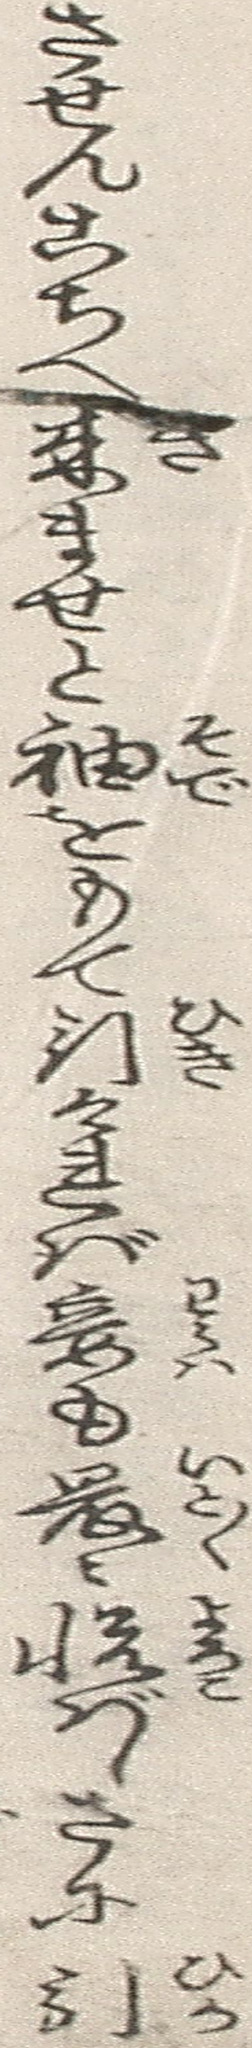させんこちへ来ませと袖をもて引けれバ妾も最々悦バしさに引
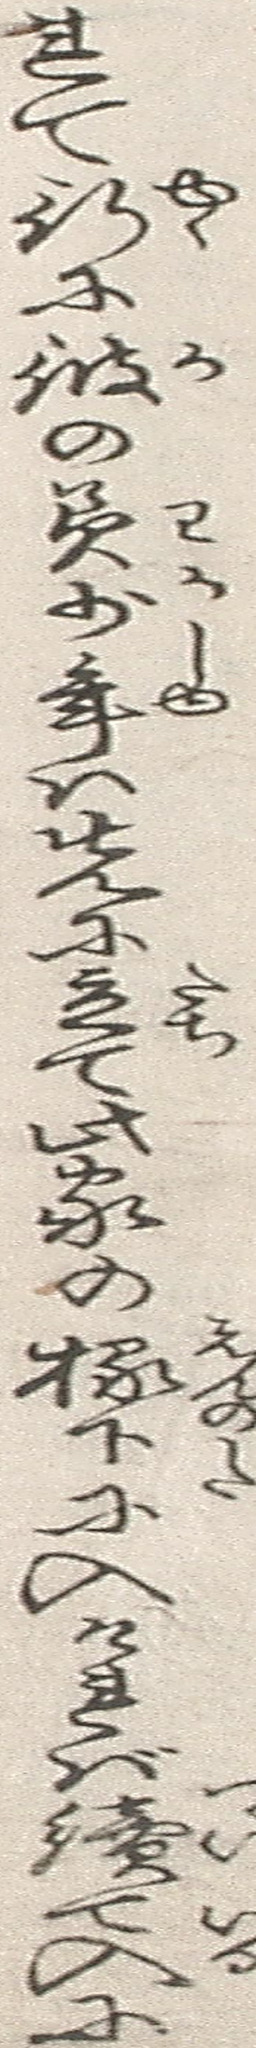れて行に彼の美少年ハ先に立て此家の縁下に入けれバ続て入に
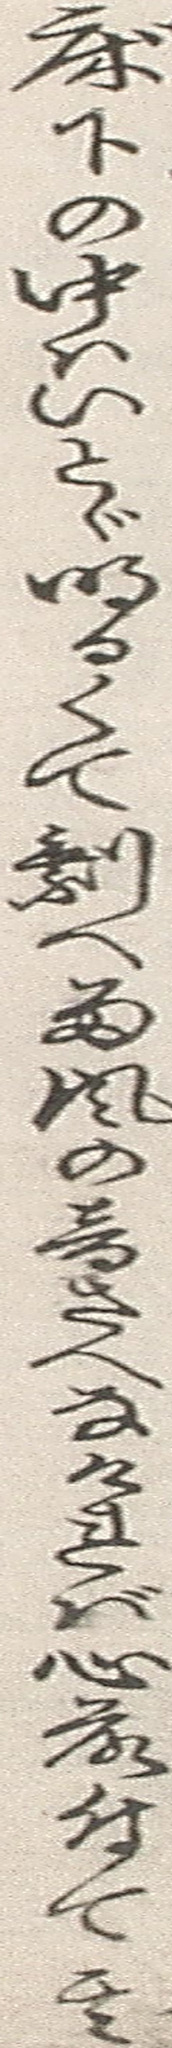床下の中ハいとゞ明るくて剰へ風雨の音さへなけれバ心落付て其
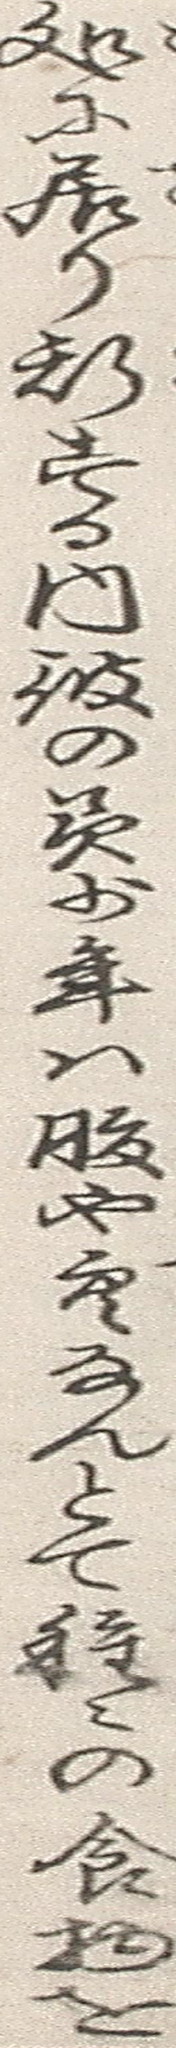処に居り斯する内彼の美少年ハ腹や空なんとて種々の食物を
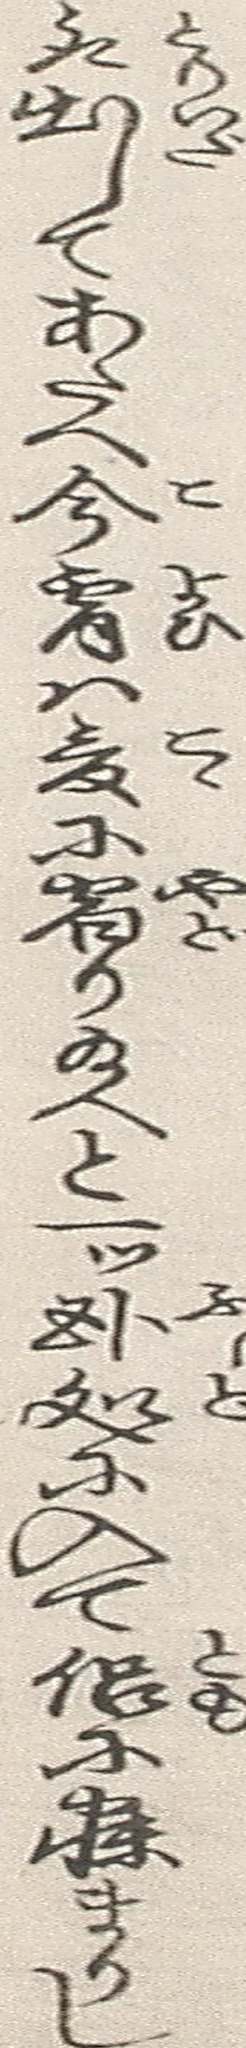取出してあたへ今宵ハ爰に宿り給へと一ッ臥処に入て俱に寐まりし
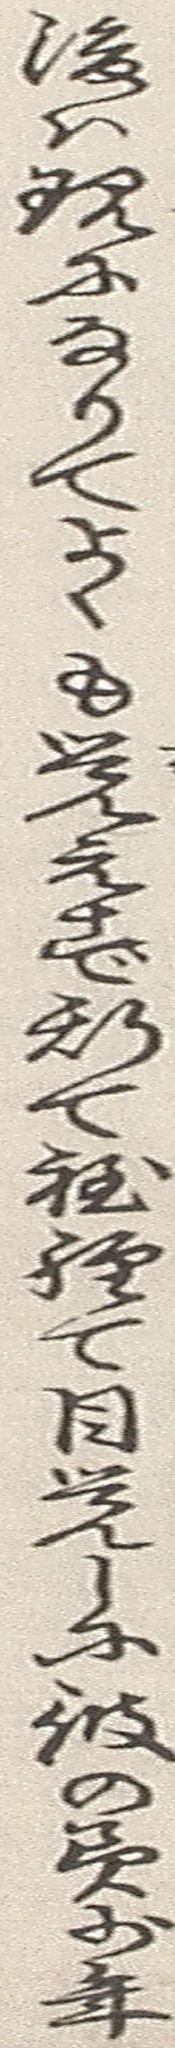後ハ現になりてよくも覚えず斯て程経て目覚しに彼の美少年
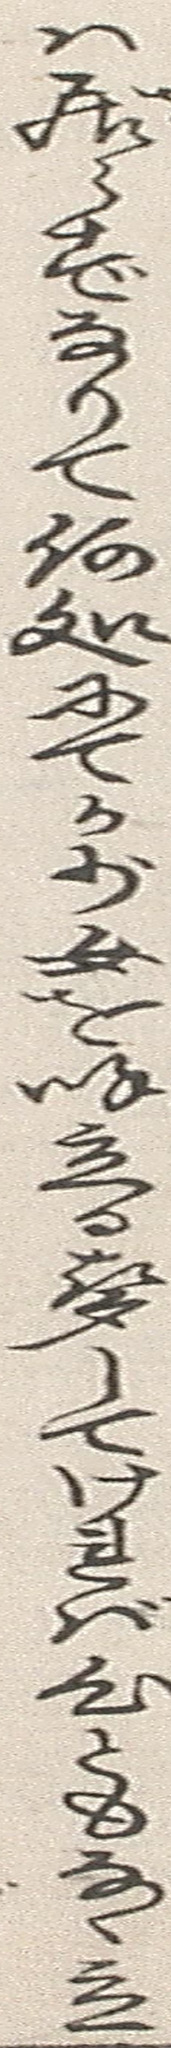ハ居らずなりて何処にてか少女を呼立る声してけれバ心ともなく立
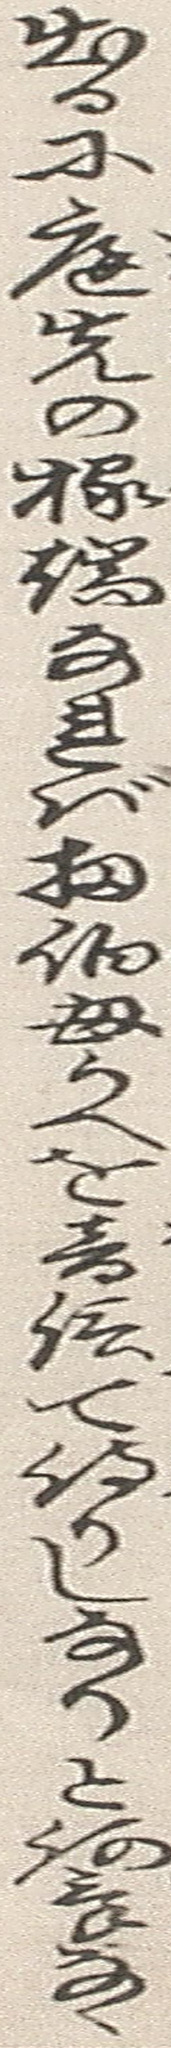出るに庭先の縁端なれバ扨伯母うへを音信て侍りしなりと何気なく
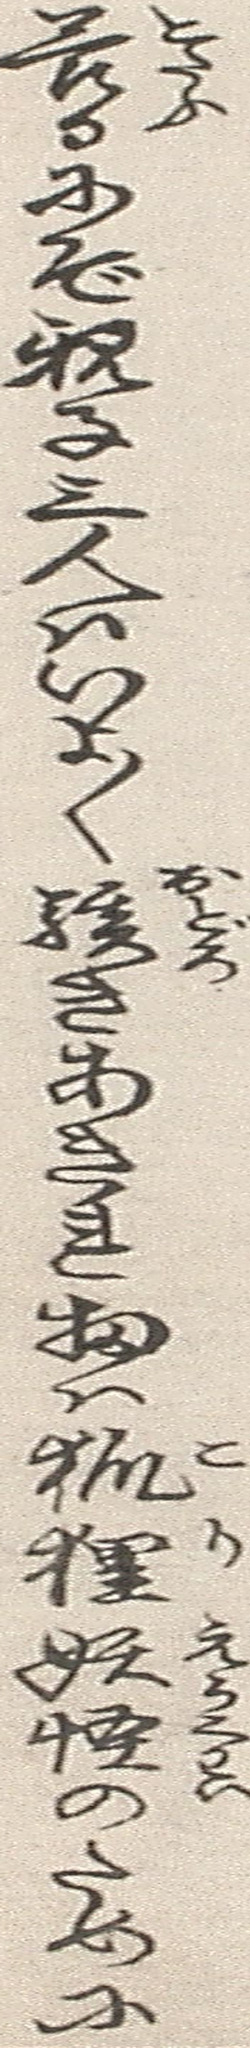答るにぞ親子三人ハいよ〳〵驚きあきれ扨ハ狐狸妖怪のために
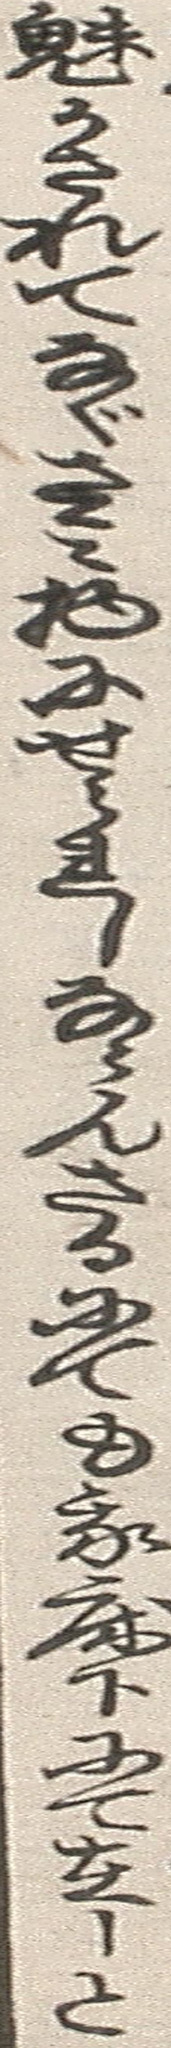魅かされてなぐさミ物にせられしならんたるにても我床下に在しと
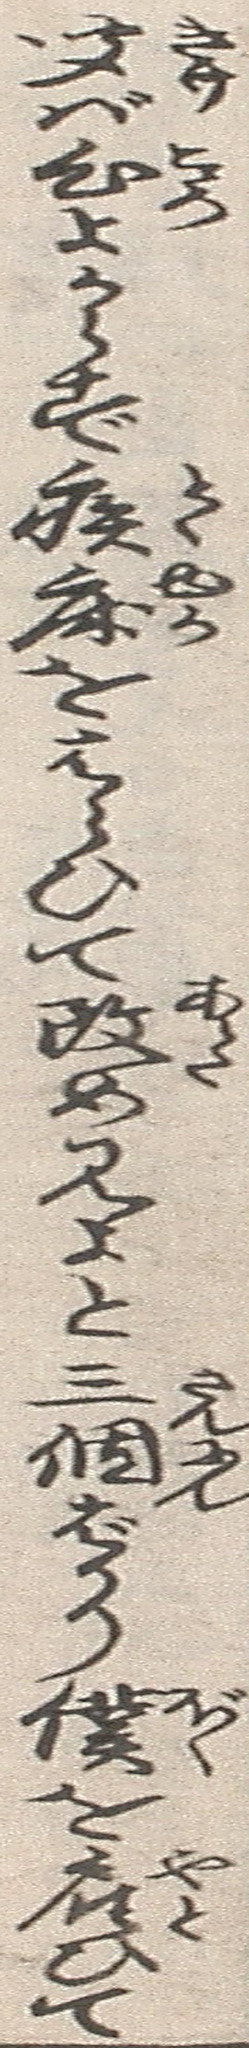聞バ心よからず疾床はらひて改め見よと三個ばかり僕を雇ひて
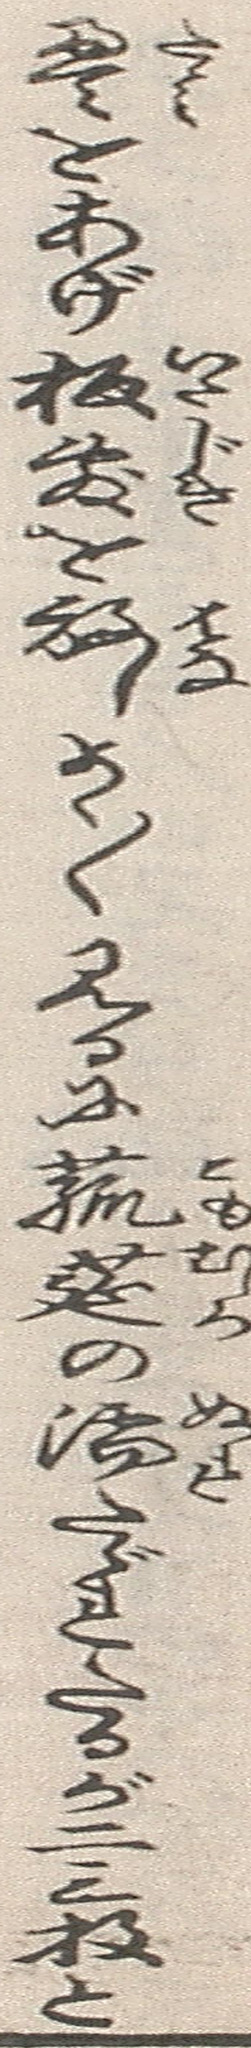畳をあげ板敷を放しよく〳〵見るに菰筵の濡たてたるが二三枚
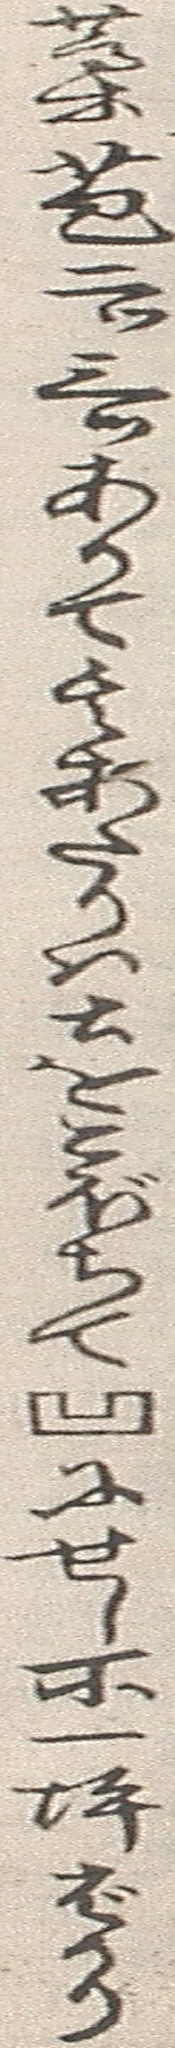藁苞二ッ三ッありて其あたりハ土をこぼちて凹にせし所一坪ばかり
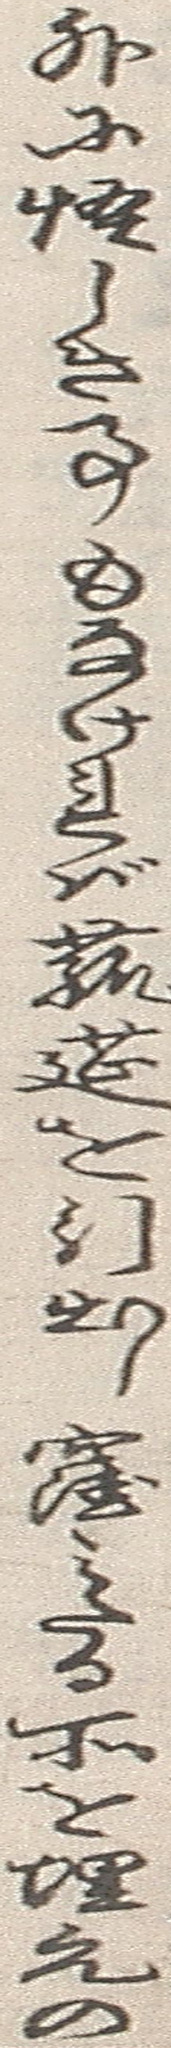外に怪しき事もなけれバ菰筵を引出し窪ミたる所を埋元の
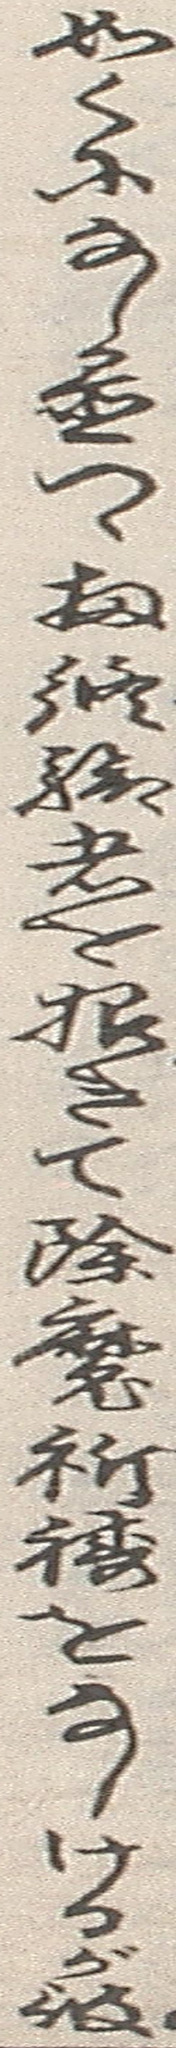如くになし置つゝ扨修験者を招きて除魔祈祷をなしけるが彼
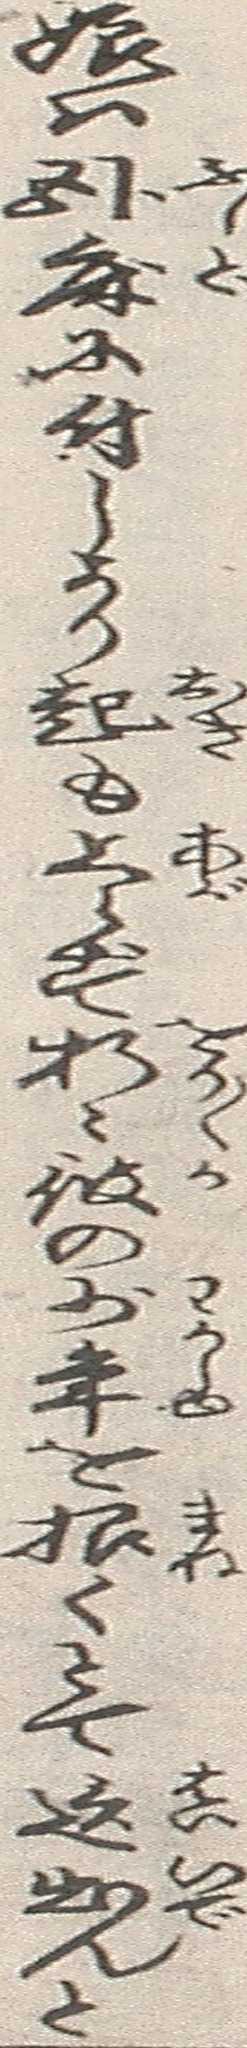娘ハ臥床に付しより起も上らず折々彼の少年を招くとて這出んと
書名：安政風聞集　上中下　全
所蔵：東京大学地震研究所図書室 Earthquake Research Institute Library, The University of Tokyo, JAPAN
